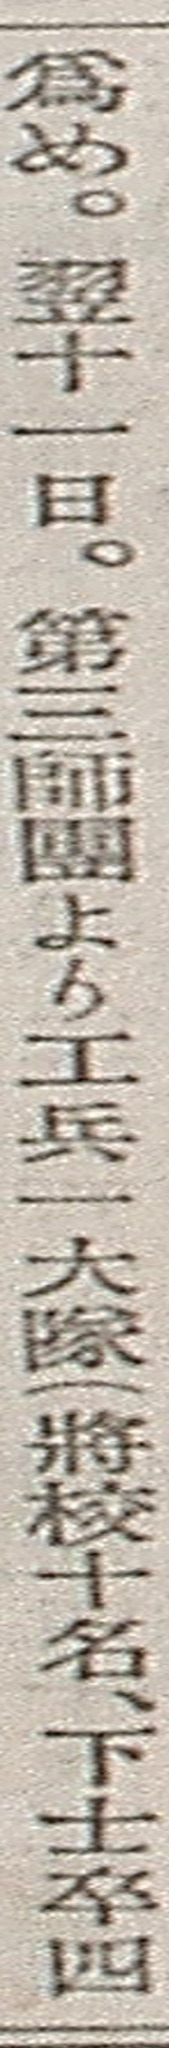為め。翌十一日。第三師団より工兵一大隊（将校十名、下士卒四
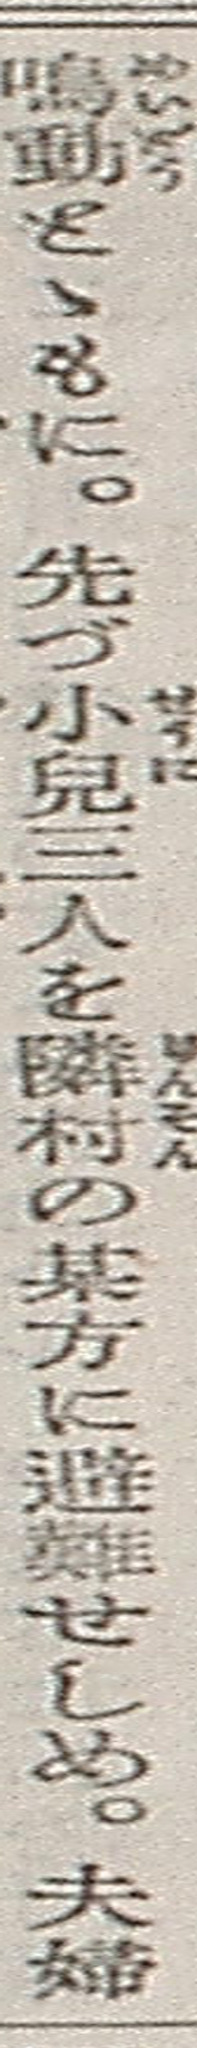鳴動とゝもに。先づ小児三人を隣村の某方に避難せしめ。夫婦
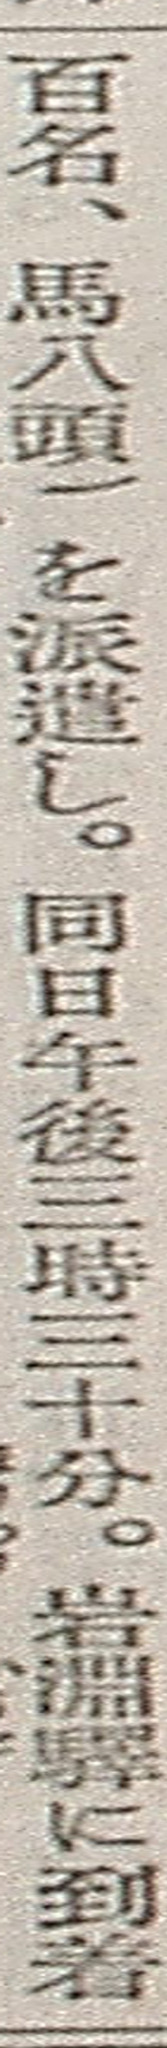百名、馬八頭）を派遣し。同日午後三時三十分。岩淵駅に到着
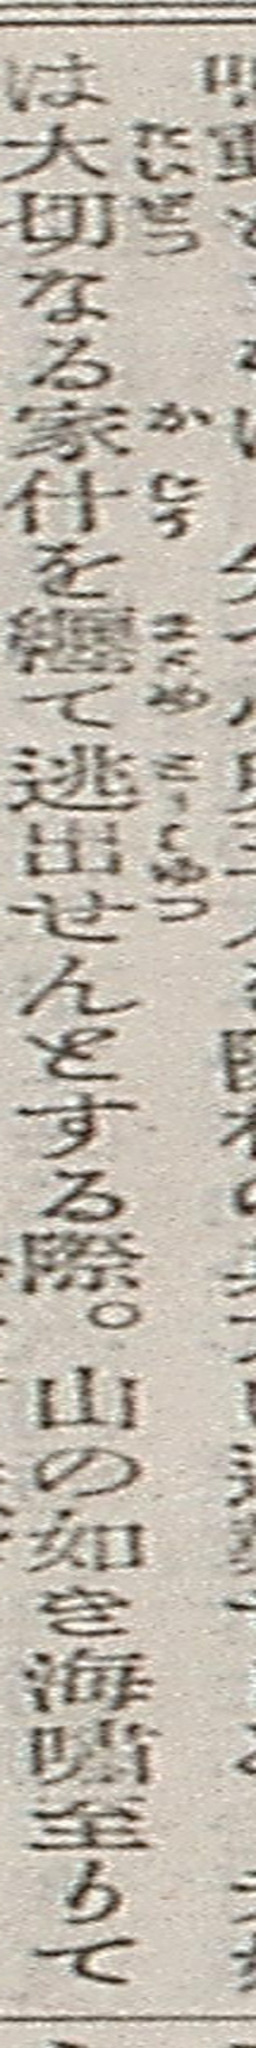は大切なる家什を纒て逃出せんとする際。山の如き海嘯至りて
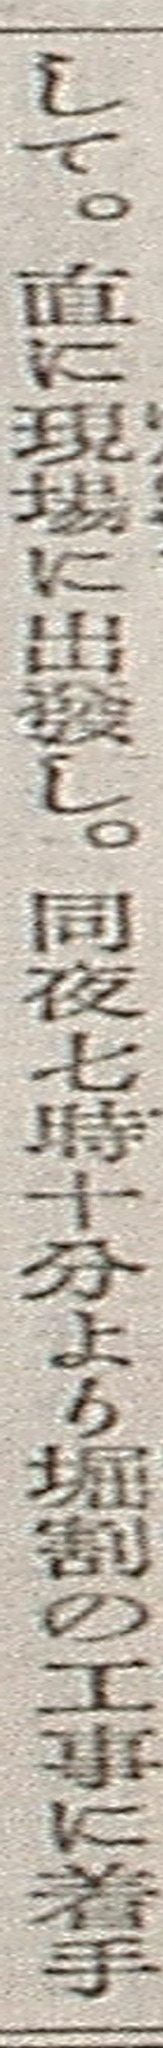して。直に現場に出発し。同夜七時十分より堀割の工事に着手
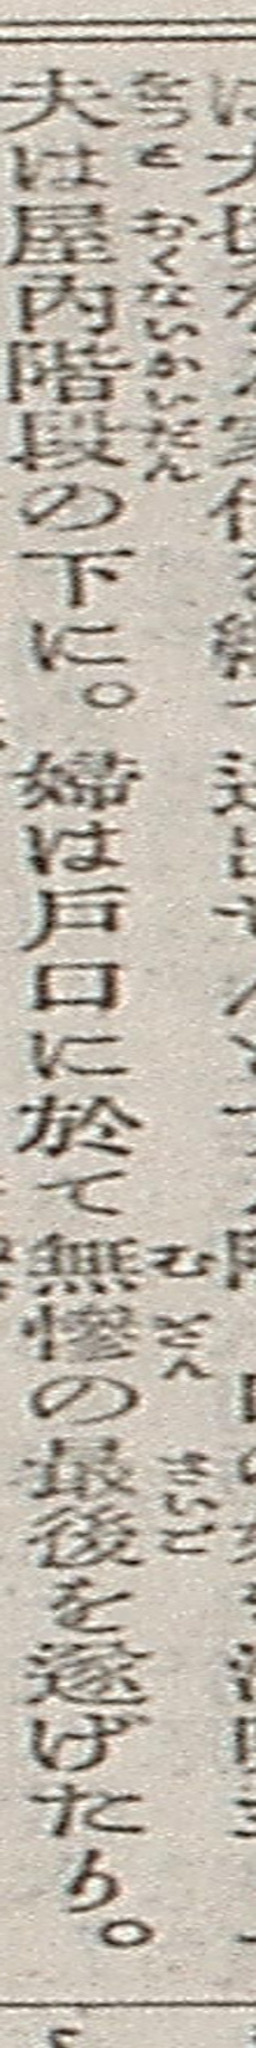夫は屋内階段の下に。婦は戸口に於て無惨の最後を遂げたり。
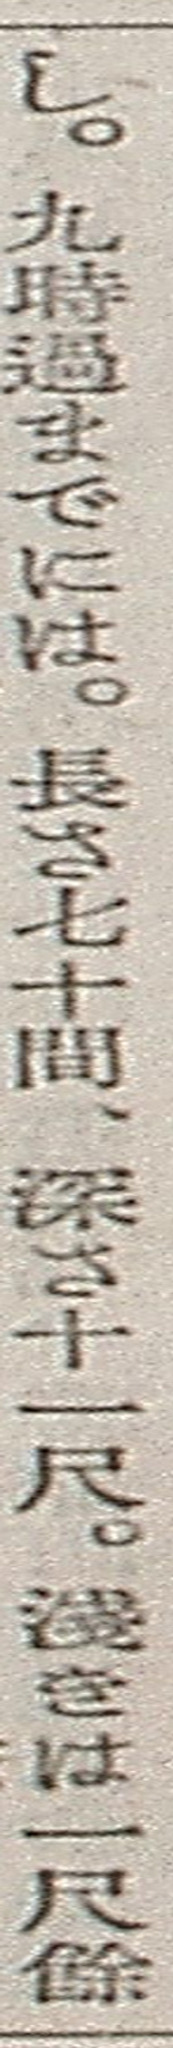し。九時過までには。長さ七十間、深さ十一尺。浅きは一尺余
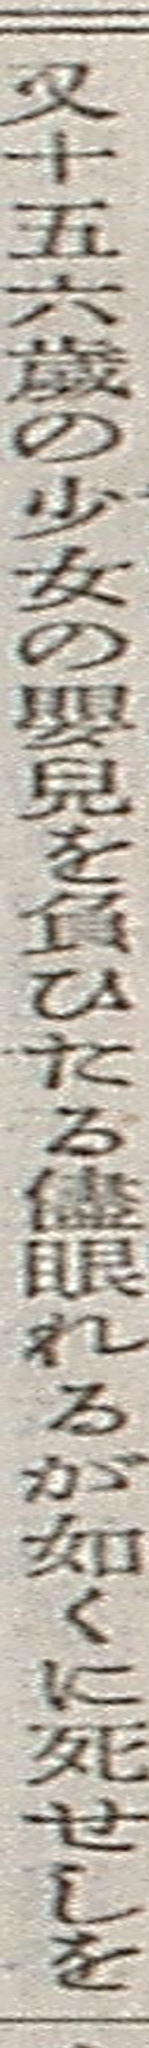又十五六歳の少女の嬰児を負ひたる侭眠れるが如くに死せしを
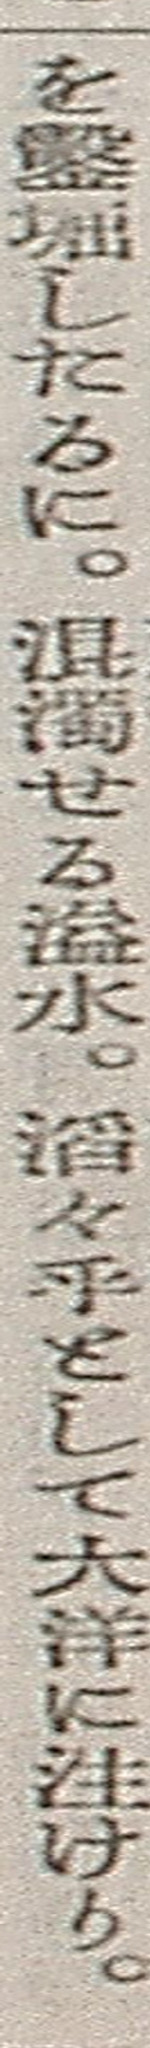を鑿堀したるに。混濁せる溢水。滔々乎として大洋に注けり。

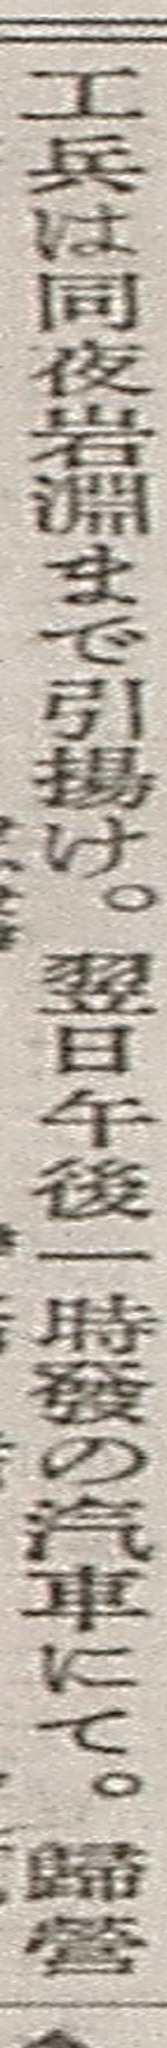工兵は同夜岩淵まで引揚け。翌日午後一時発の汽車にて。帰営
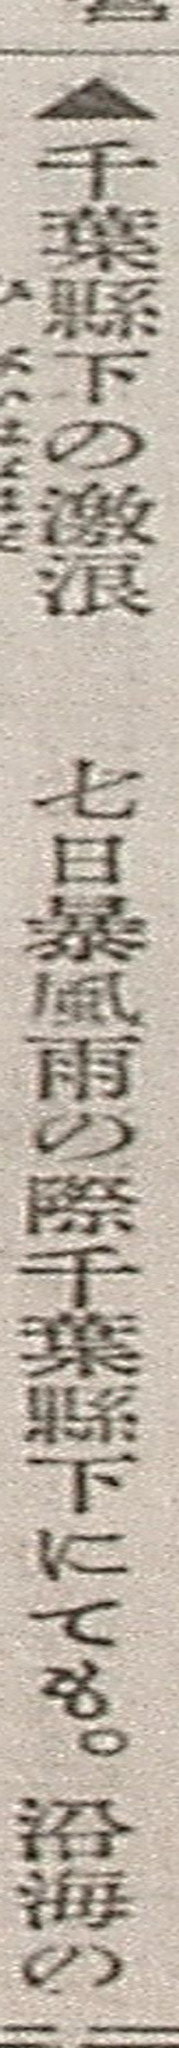▲千葉県下の激浪七日暴風雨の際千葉県下にても。沿海の
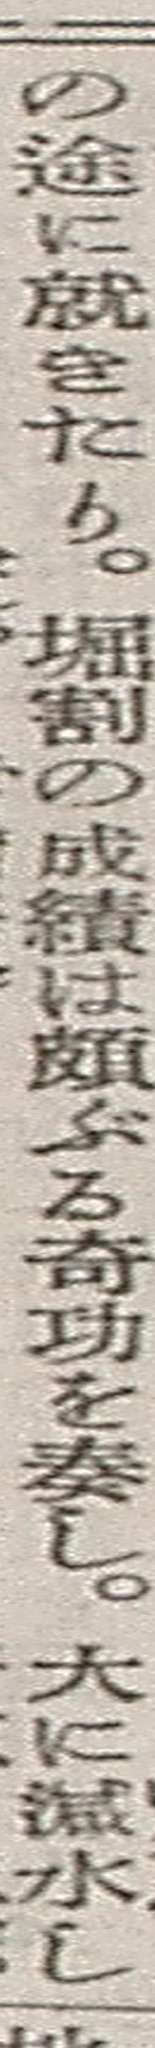の途に就きたり。堀割の成績は頗る奇功を奏し。大に減水し
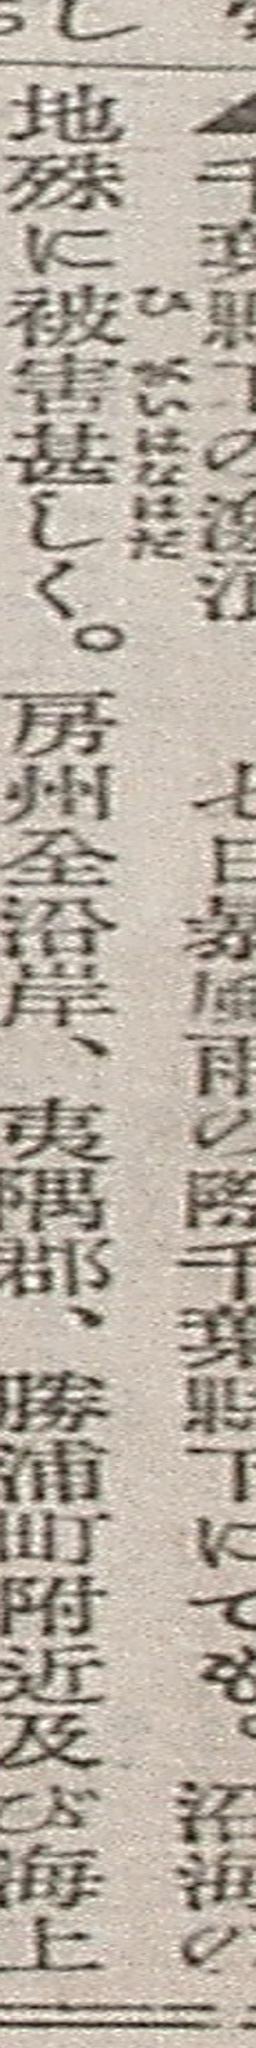地殊に被害甚しく。房州全沿岸、夷隅郡、勝浦町附近及び海上
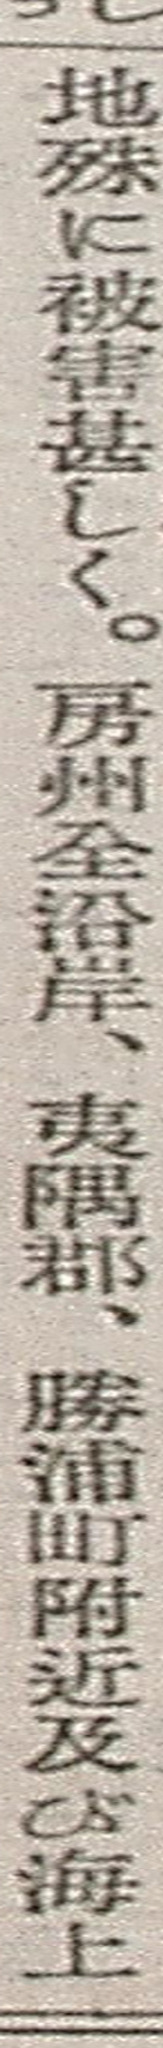地殊に被害甚しく。房州全沿岸、夷隅郡、勝浦町附近及び海上
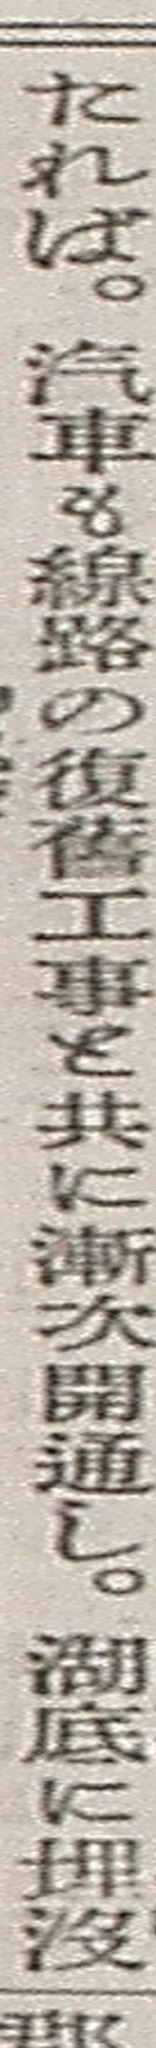たれば。汽車も線路の復旧工事と共に漸次開通し。湖底に埋没
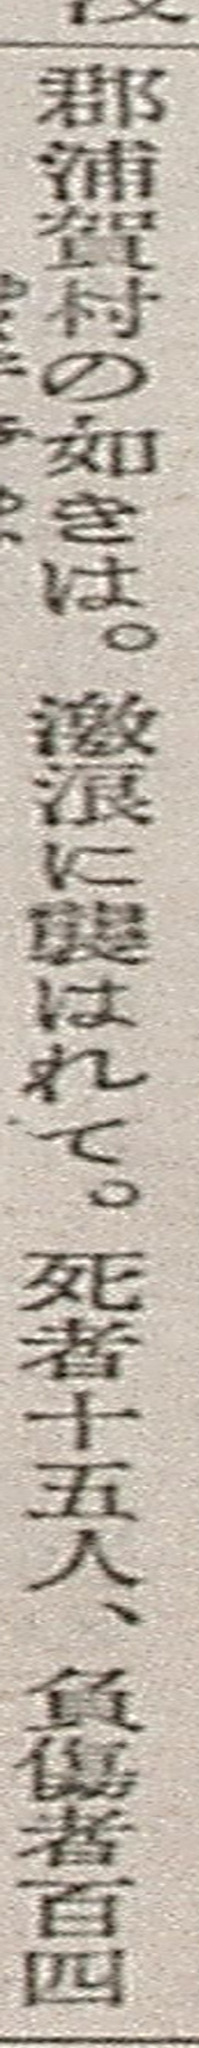郡浦賀村の如きは。激浪に襲はれて。死者十五人、負傷者百四
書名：風俗畫報臨時増刊第百九十九號　明治三十二年十月各地災害圖會（前編之續）
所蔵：東京大学地震研究所図書室 Earthquake Research Institute Library, The University of Tokyo, JAPAN
